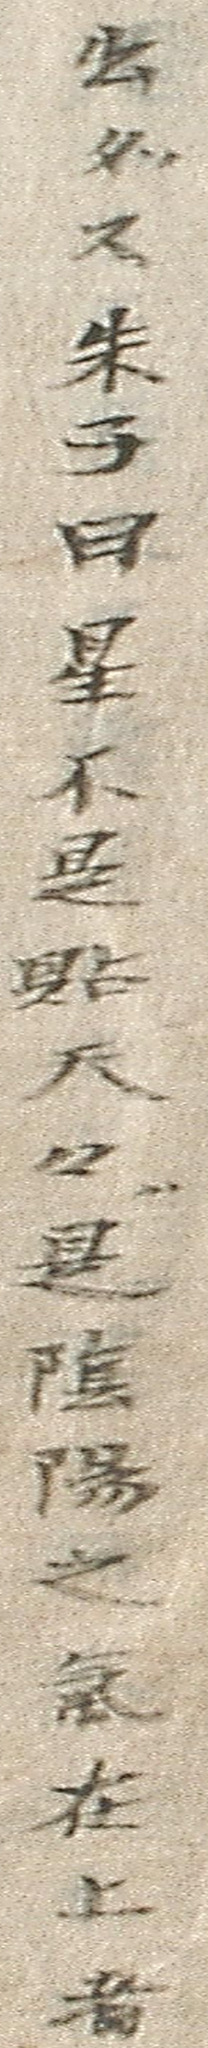出処ス朱子曰星不是貼天々是陰陽之気在上者
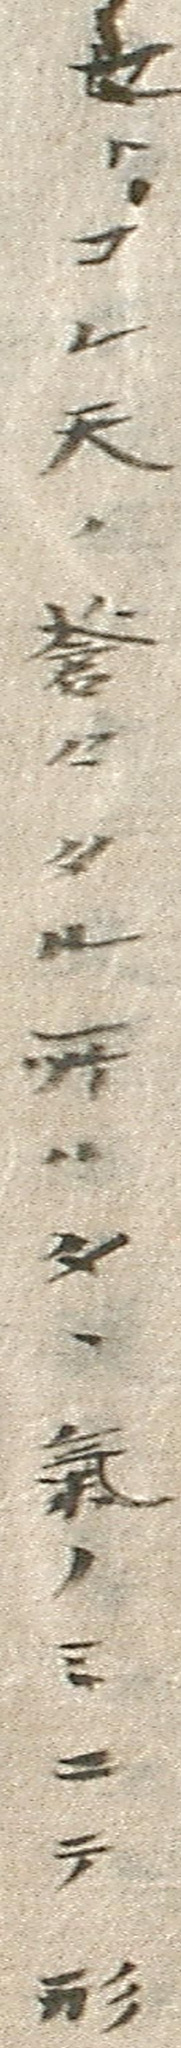セトコレ天ノ蒼々タル所ハタヽ気ノミニテ形
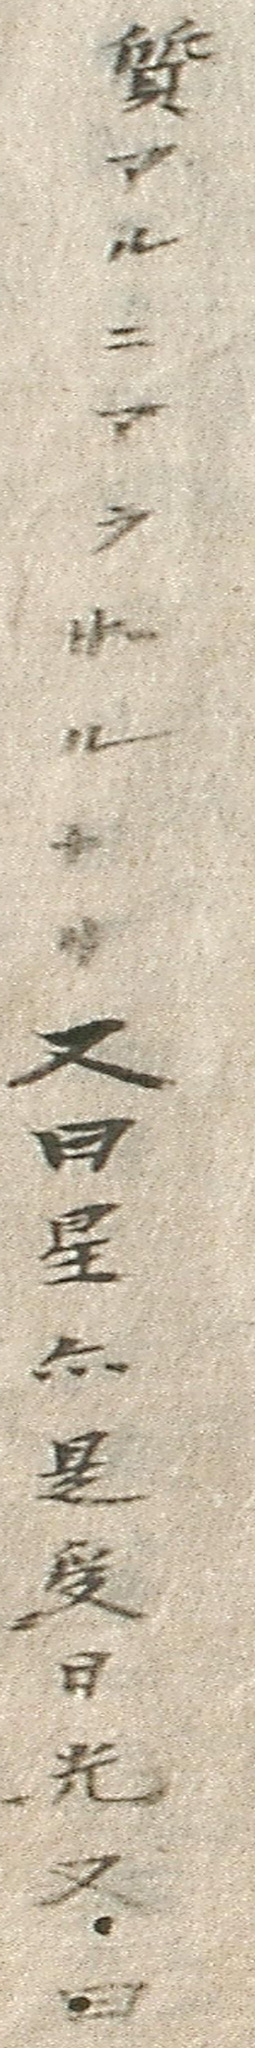質アルニアラサルナリ又日星亦是受ニ日光又曰
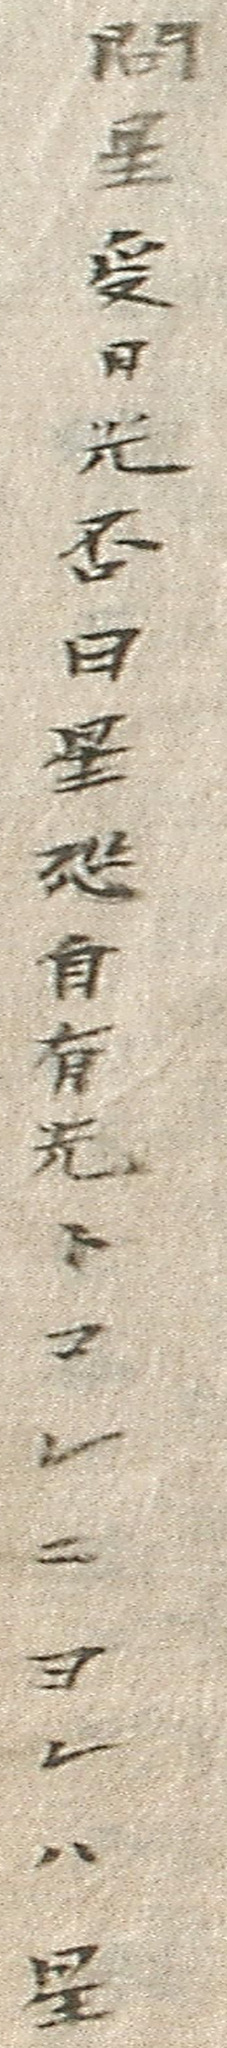問星受日光否日星恐自有光トコレニヨレハ星
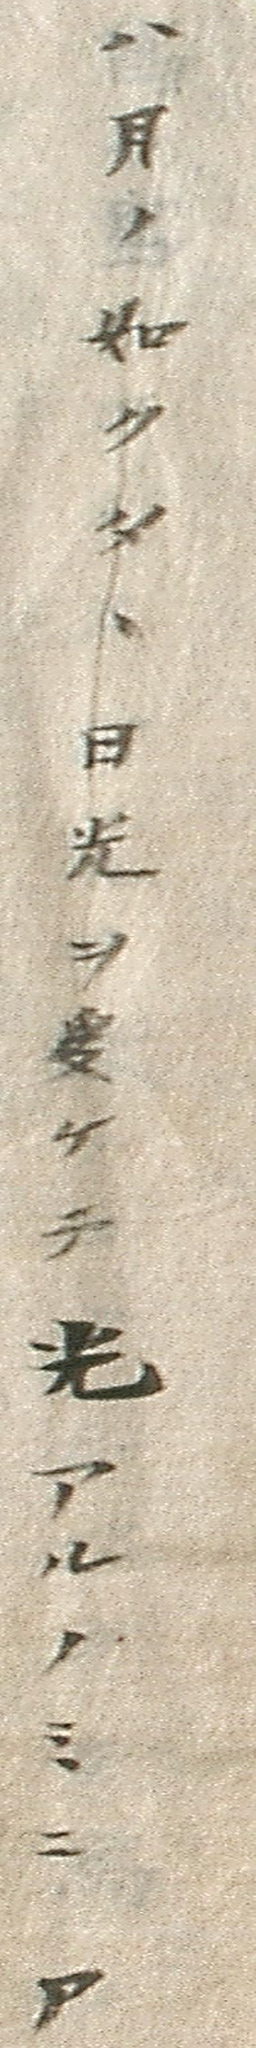ハ月ノ如クタヽ日光ヲ受ケテ光アルノミニア
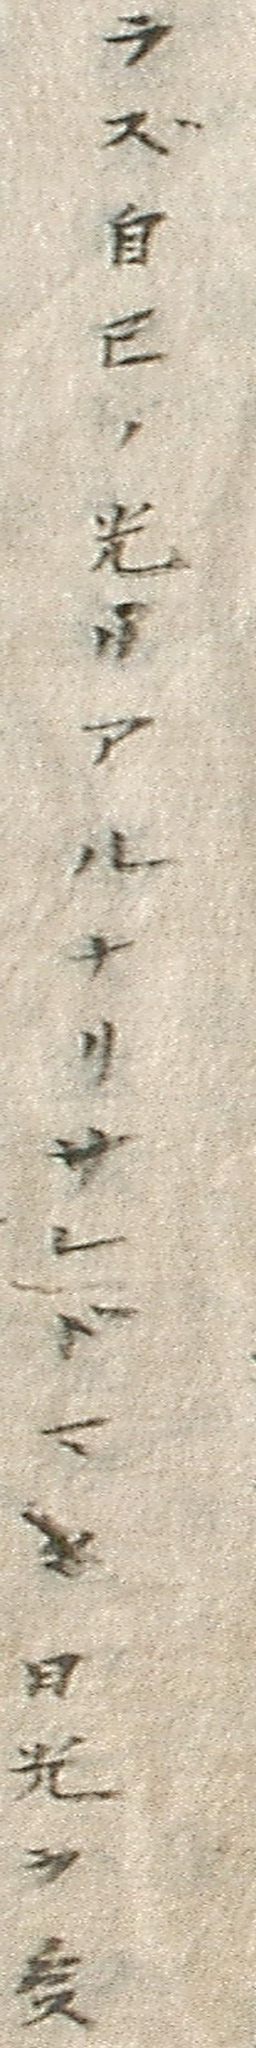ラズ自己ノ光リアルナリサレドマタ日光ヲ受
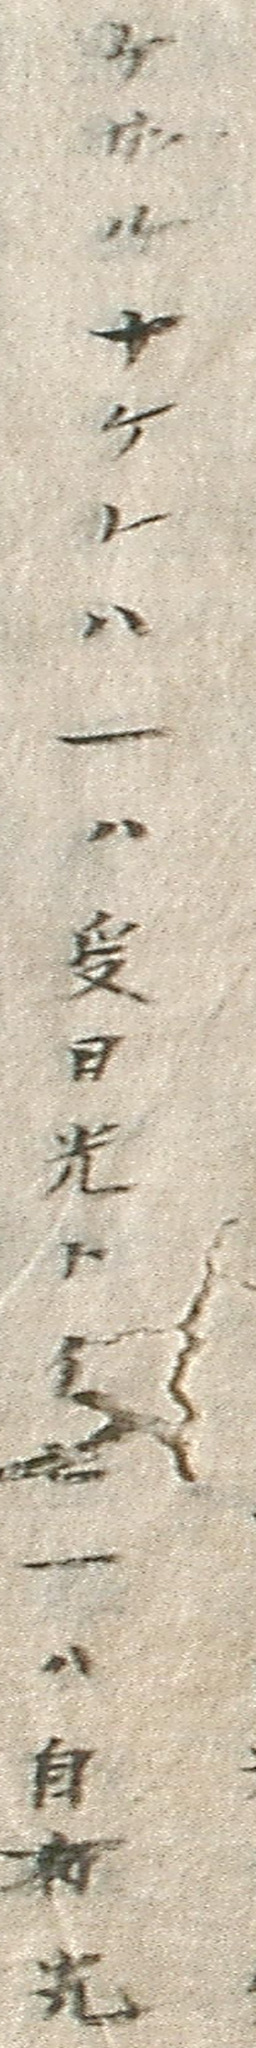ケサルナケレハ一ハ受日光トイフ一ハ自有光
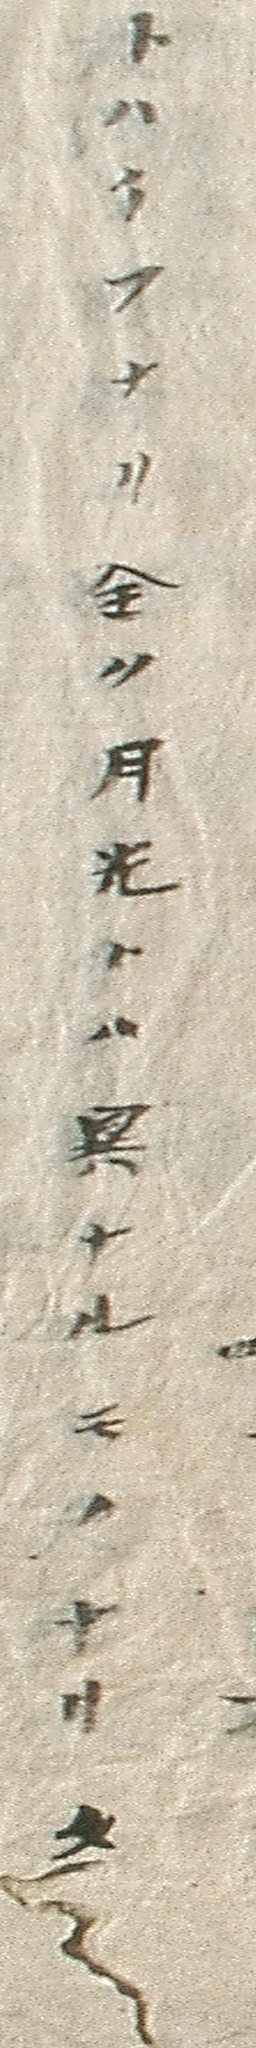トハイフナリ全ク月光トハ異ナルモノナリタ
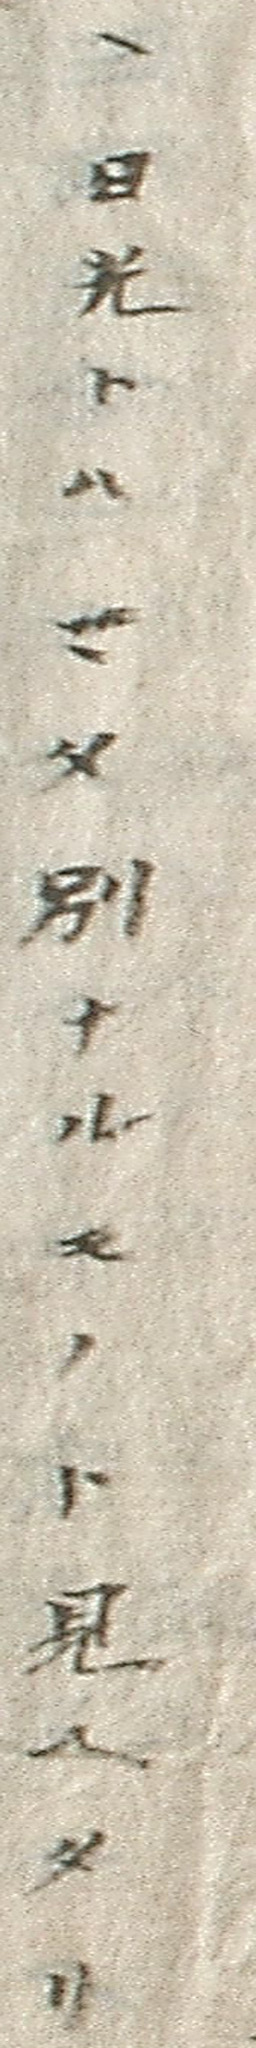ヽ日光トハマタ別ナルモノト見ヘタリ

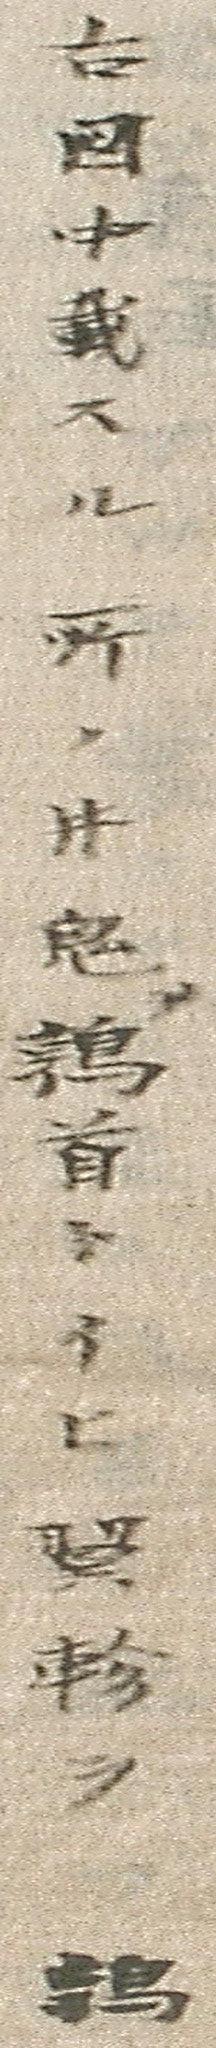右図中載スル所ノ井鬼鶉首トイヒ翼軫ヲ鶉
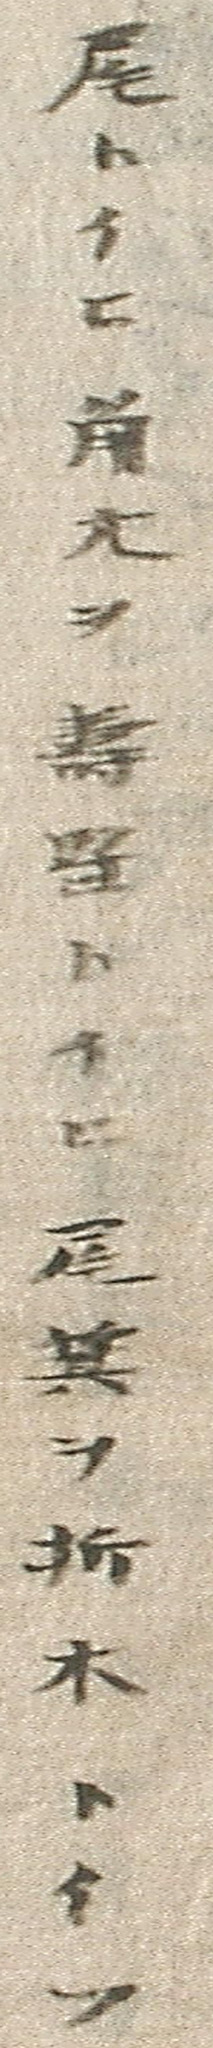尾トイヒ角亢ヲ壽星トイヒ尾箕ヲ折木トイフ
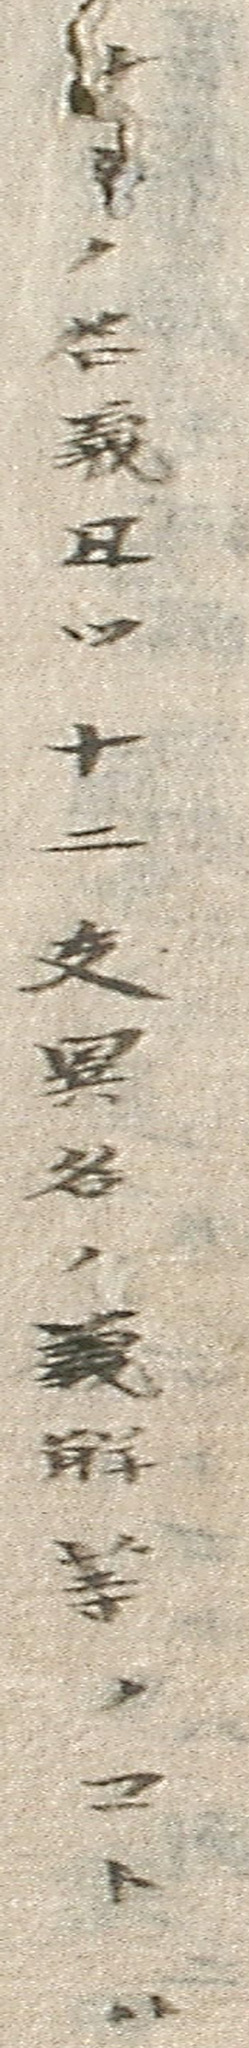ナト？ノ名義且ツ十二支異名ノ義觧等ノコトハ
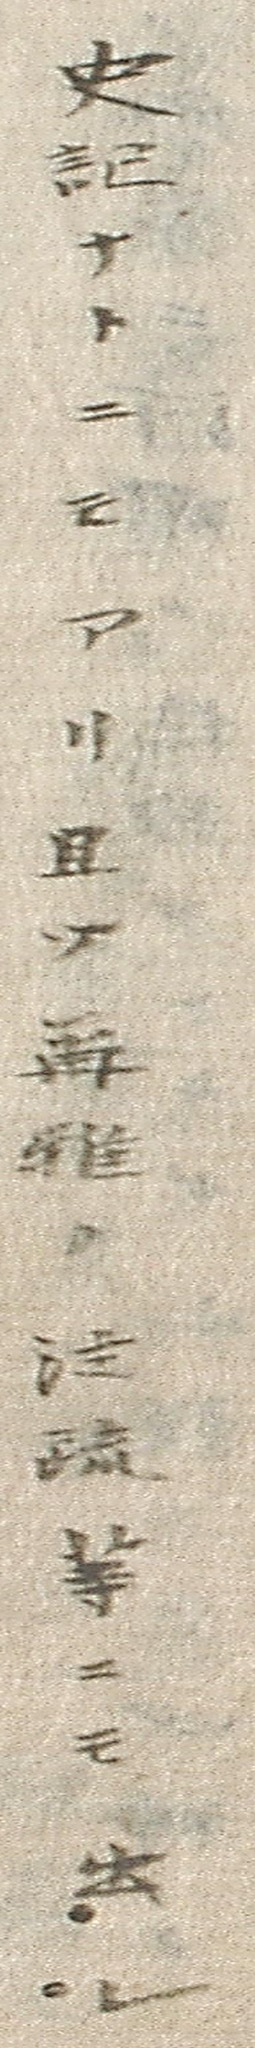史記ナトニモアリ且ツ爯雅ノ注疏等ニモ出レ
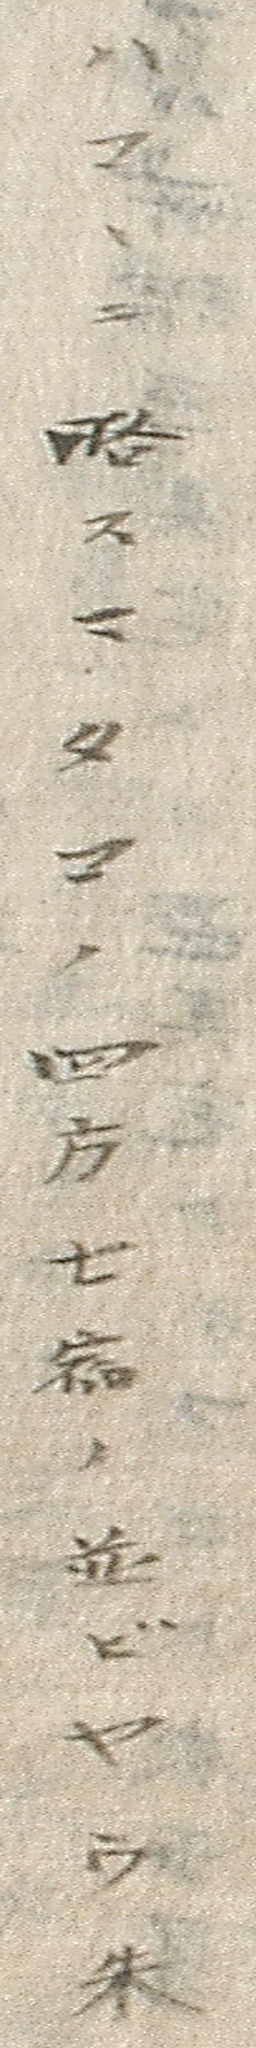ハマヽニ略スマタコノ四方七宿ノ並ビヤウ朱
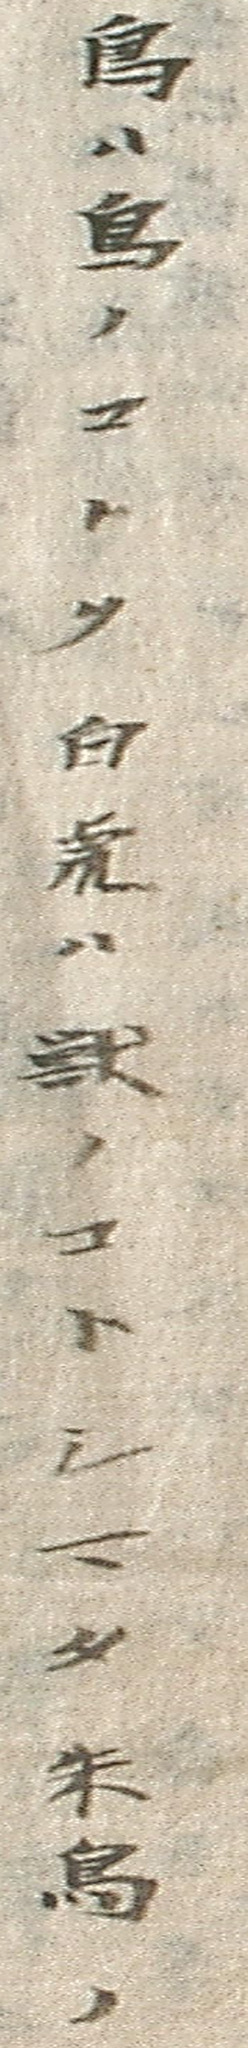鳥ハ鳥ノコトク白虎ハ獣ノコトシマタ朱鳥ノ
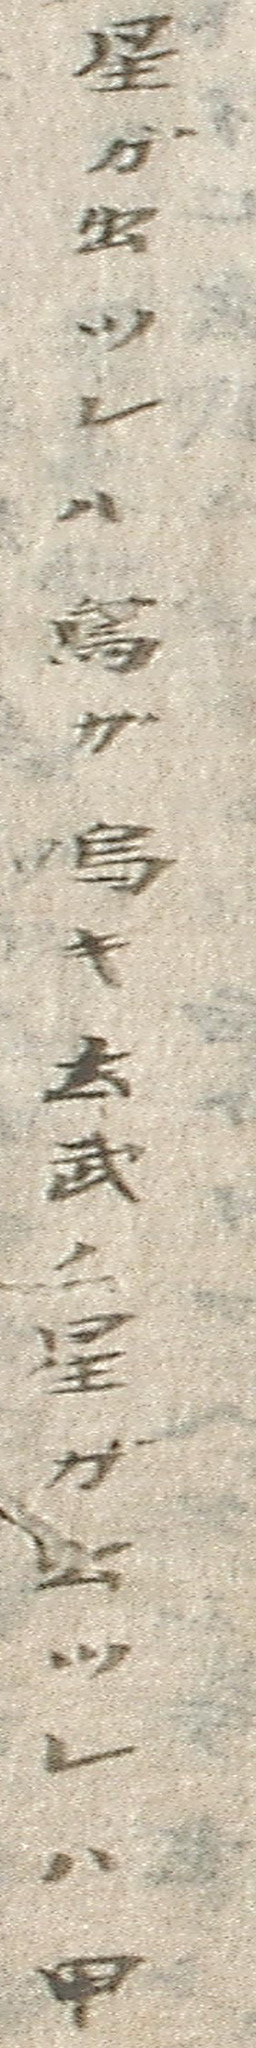星ガ出ツレハ鳥ガ鳴キ玄武ノ星ガ出ツレハ甲
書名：天學便蒙図説
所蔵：東京大学地震研究所図書室 Earthquake Research Institute Library, The University of Tokyo, JAPAN
